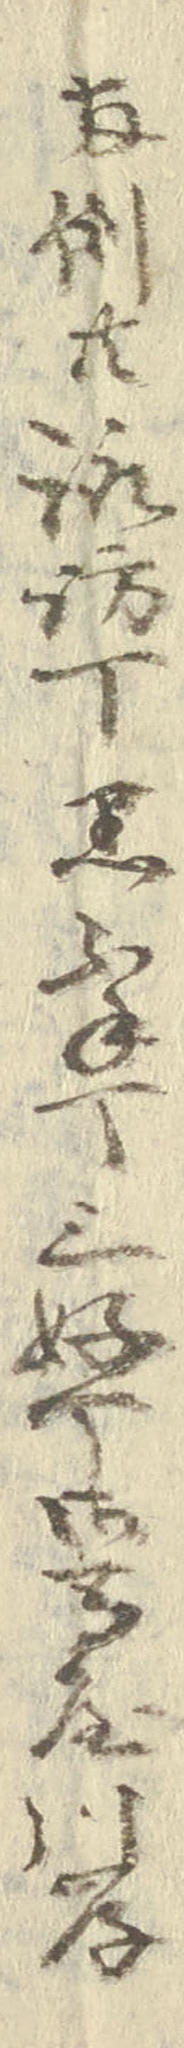両側共諏訪丁黒ふね丁三好丁御馬屋川岸
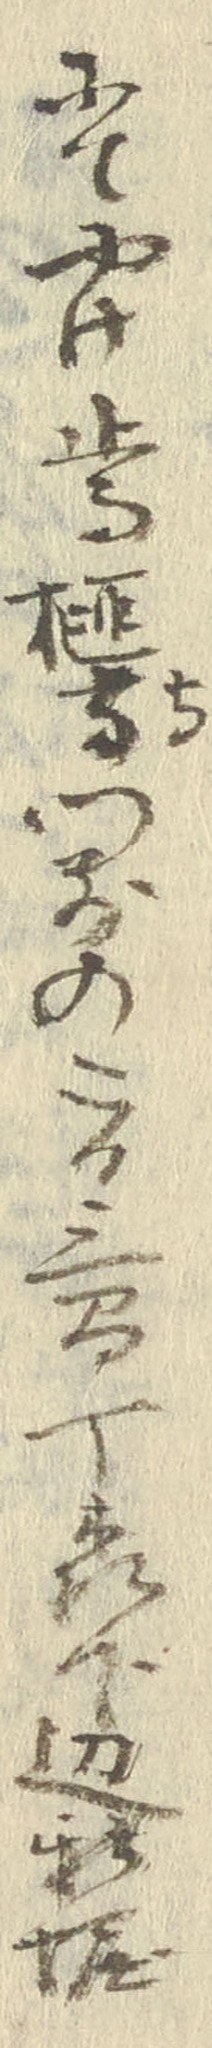にてやけ止る榧寺門前のこる三間丁森下辺新堀
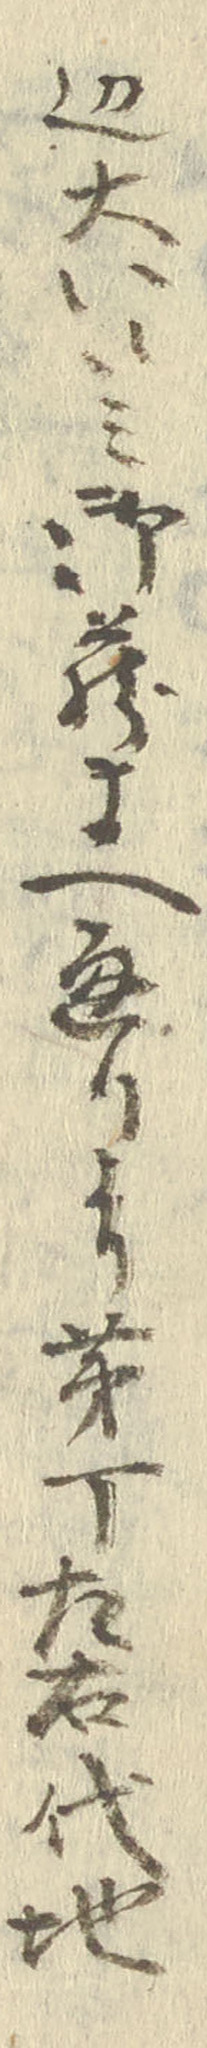辺大いたミ御蔵まへ通りより茅丁左右代地
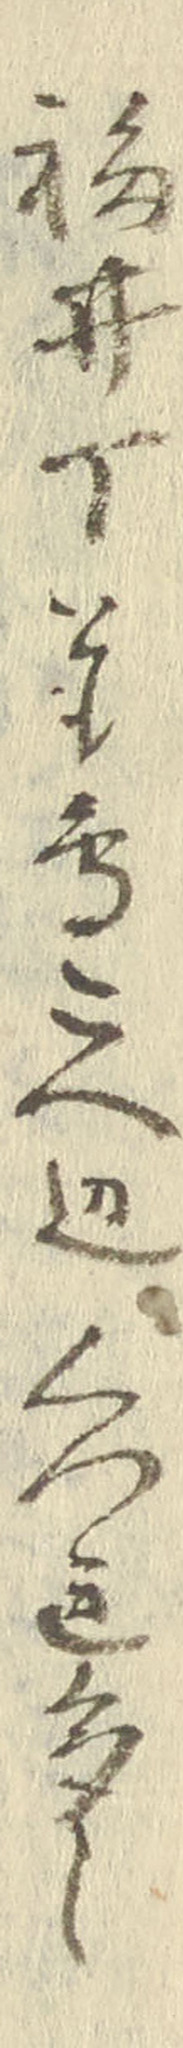福井丁とも鳥こへ辺くつれ多し
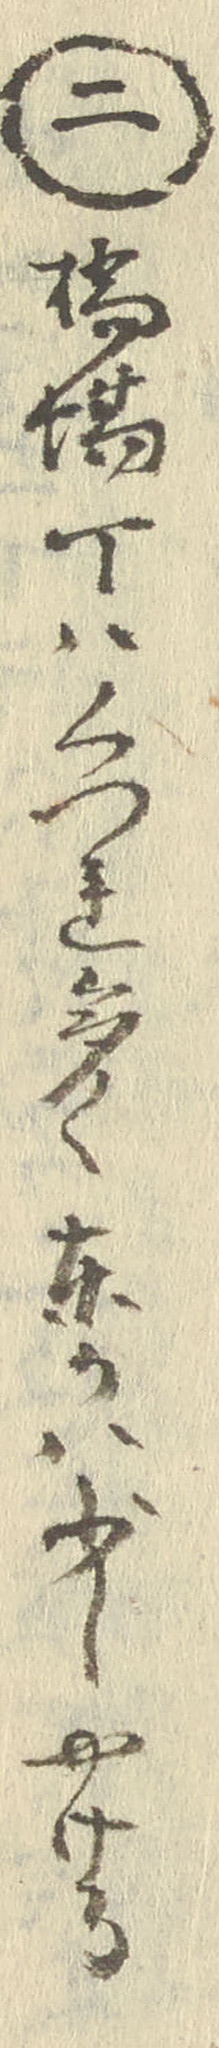二橋場丁ハくつれ多く東かハ少しやける
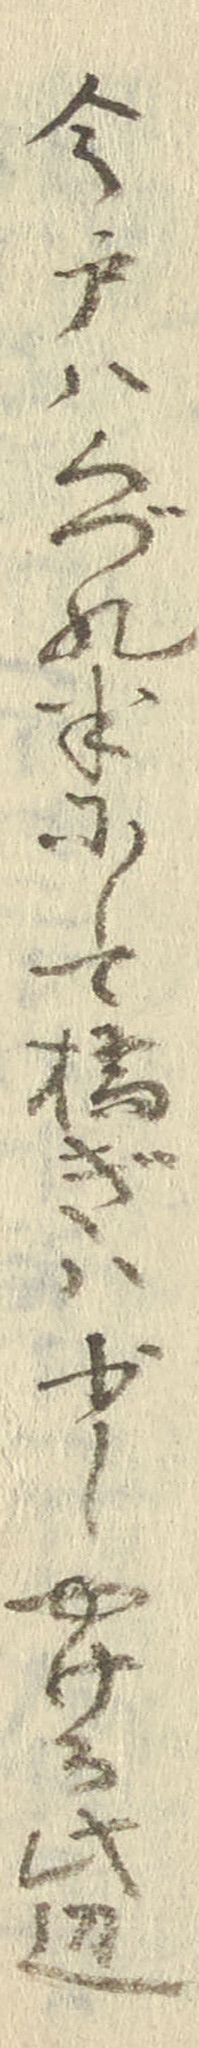今戸ハくづれ半にて橋ぎハ少しやける此辺
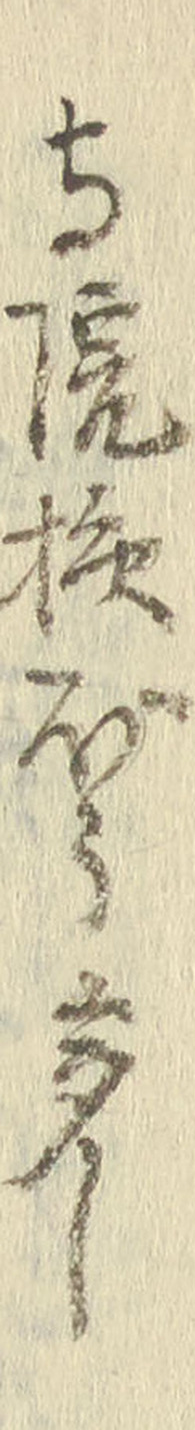寺院損ぼう多し
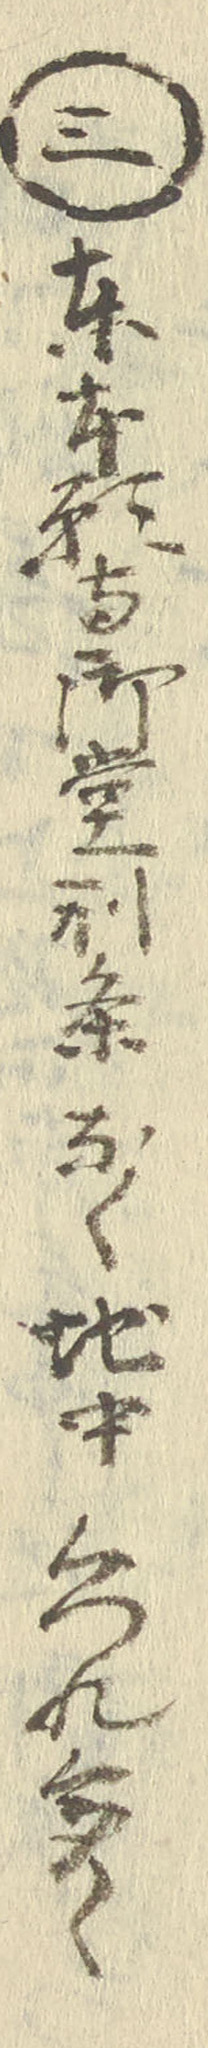三東本願寺御堂別条なく地中くつれ多く
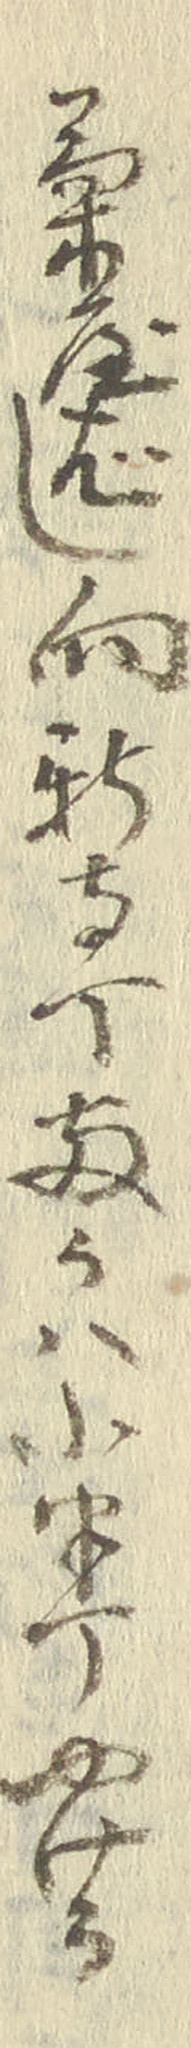菊屋ばし向新寺丁両かハに半丁やける
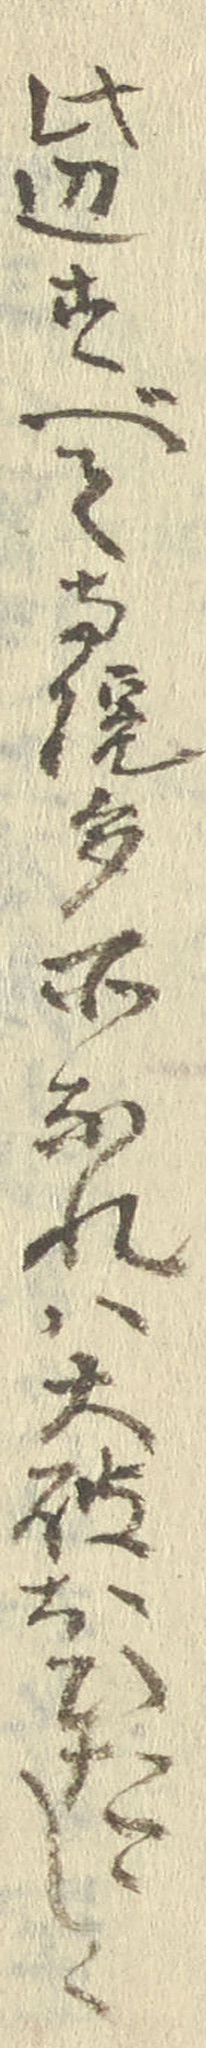此辺すべて寺院多所なれハ大破おひたゝしく
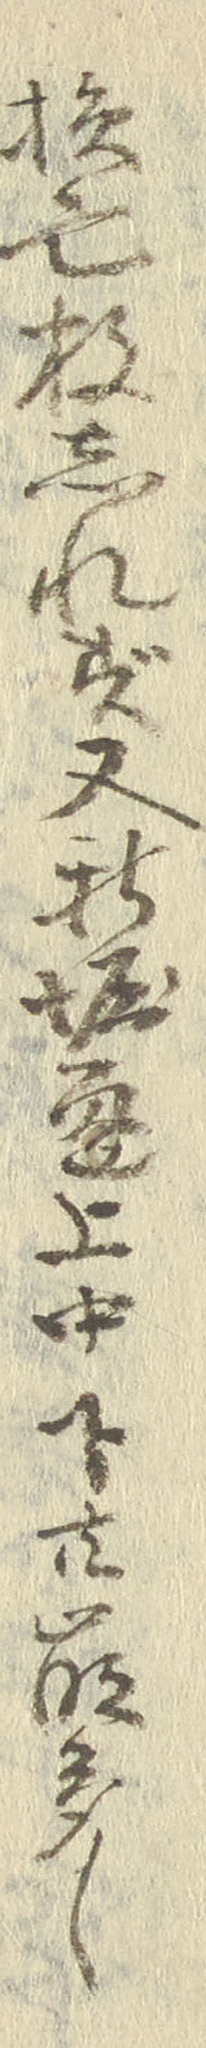損亡数しれず又新堀通上中下共崩多し
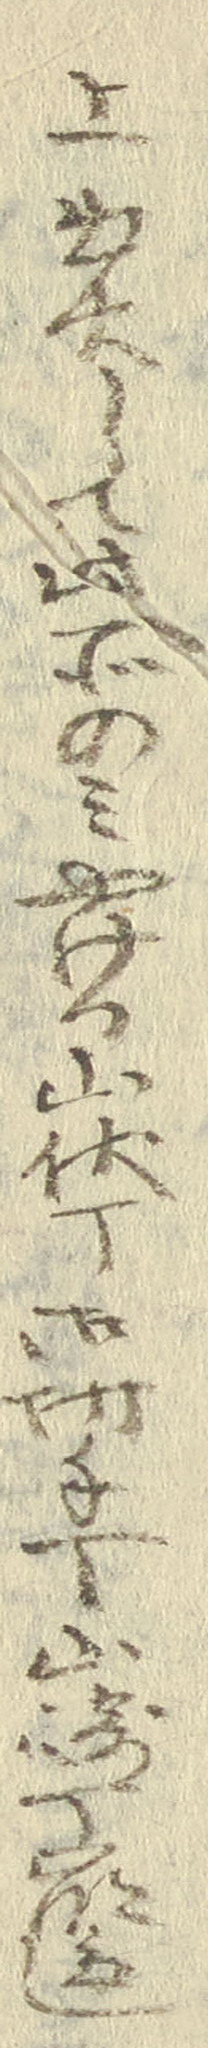上出火して此所のミやける山伏丁御切手丁山崎丁崩多し
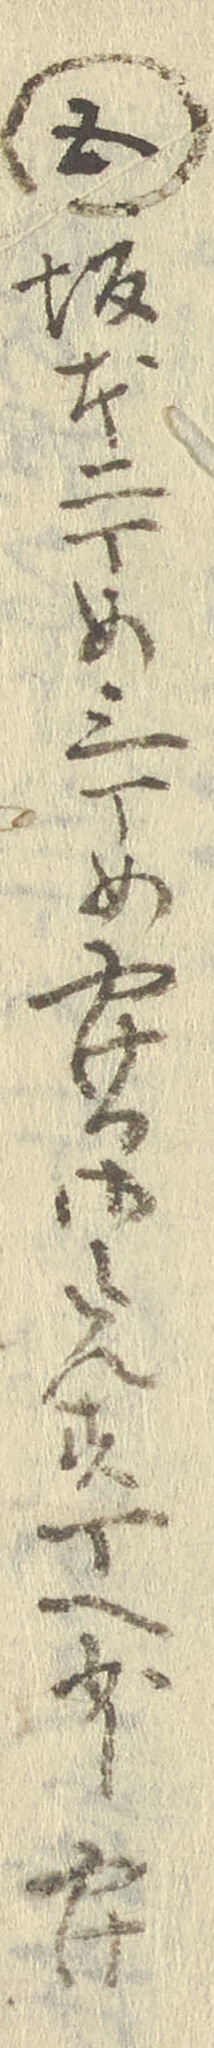五坂本二丁め三丁めやける御たんす丁へ少しやけ
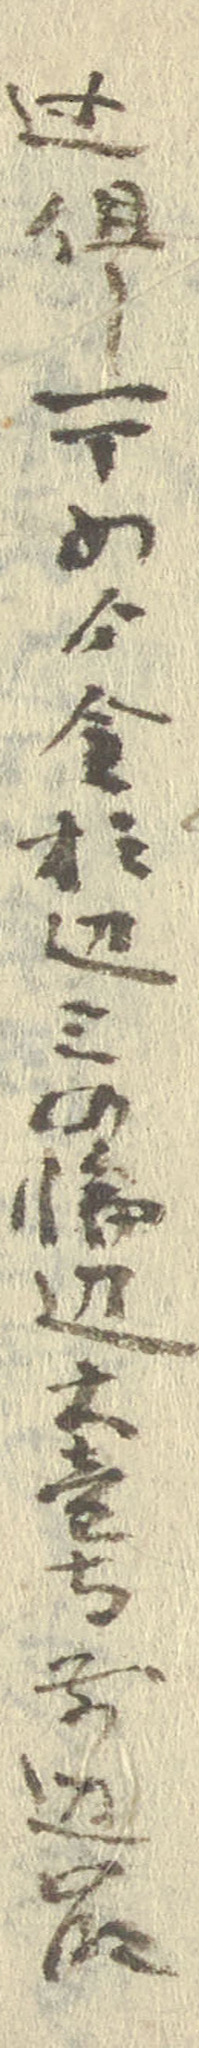込但し一丁めゟ金杉辺ミの輪辺大？寺前辺崩
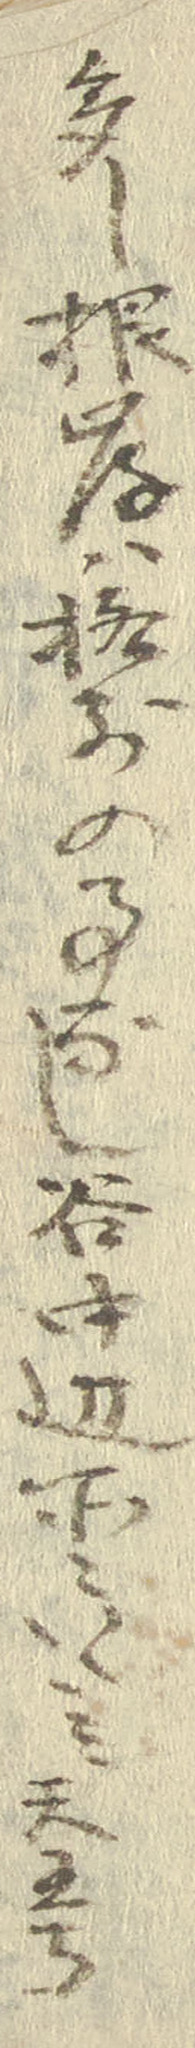多し根岸ハ格別の事なし谷中辺所〻いたミ天王寺

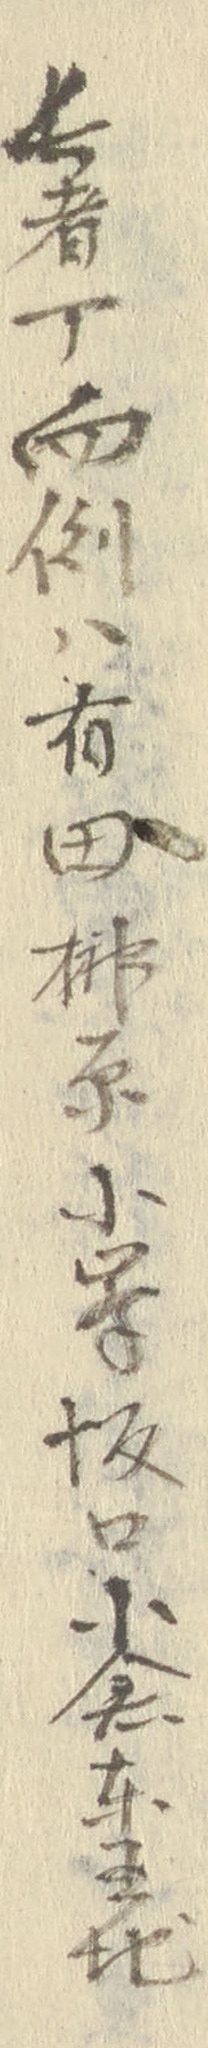長者丁向側ハ有田榊原小峯坂口小倉東王地
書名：御府内御屋敷方市中共地震類焼場所明細書之冩兼街道筋近郷聞書
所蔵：東京大学総合図書館 General Library in the University of Tokyo, JAPAN
